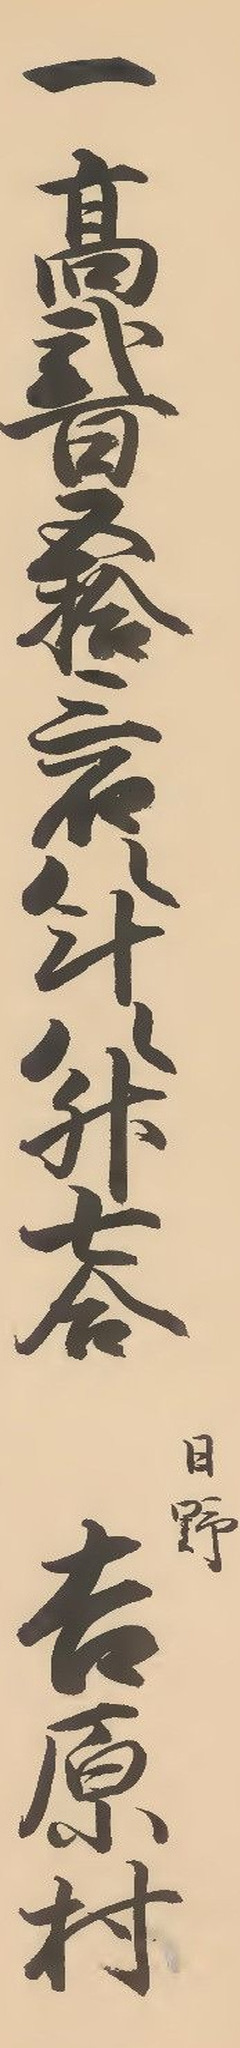一高弐百五拾三石八斗八升七合吉原村
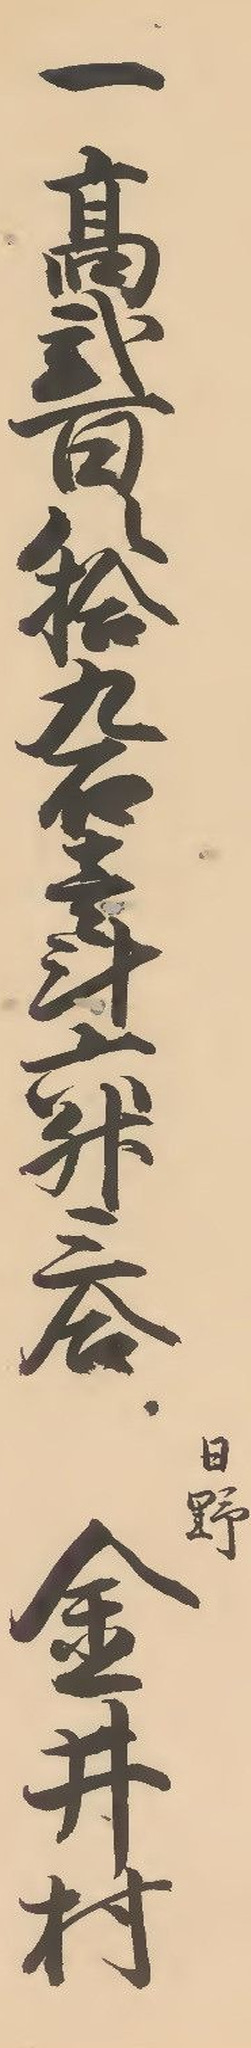一高弐百八拾九石壱斗六升三合金井村

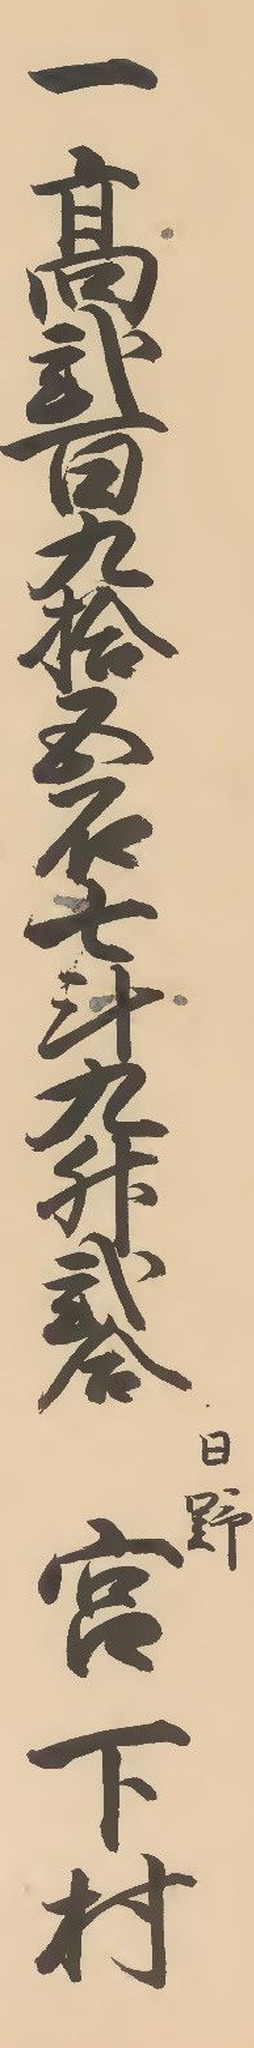一高弐百九拾五石七斗九升弐合宮下村
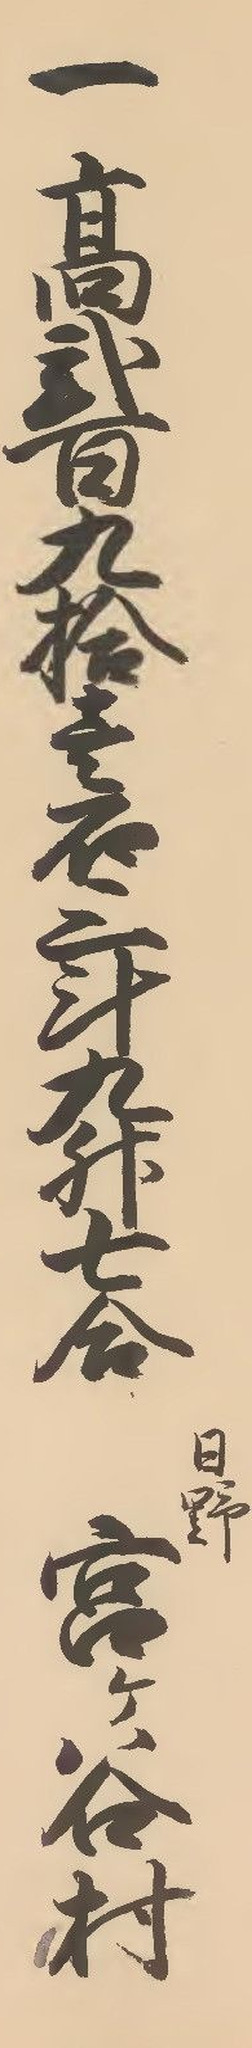一高弐百九拾壱石三斗九升七合宮ヶ谷村
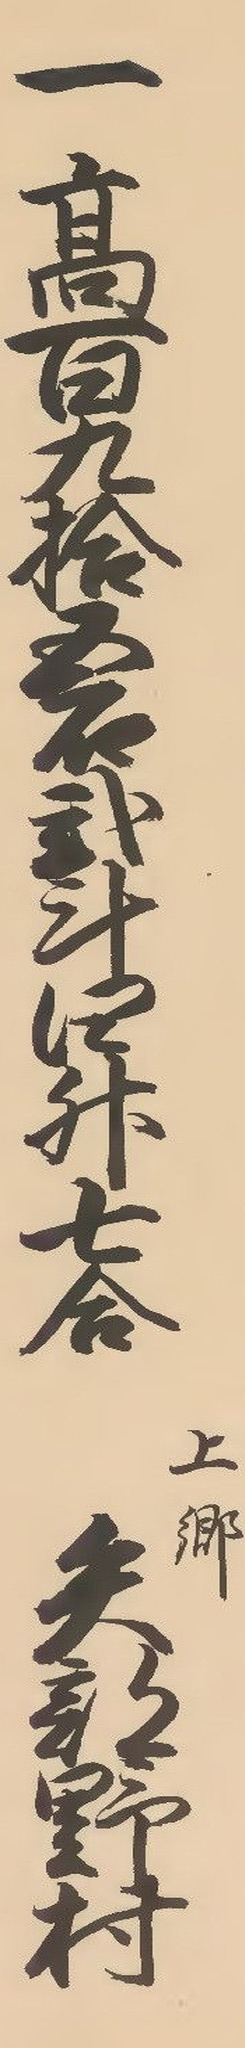一高百九拾五石弐斗四升七合矢部野村
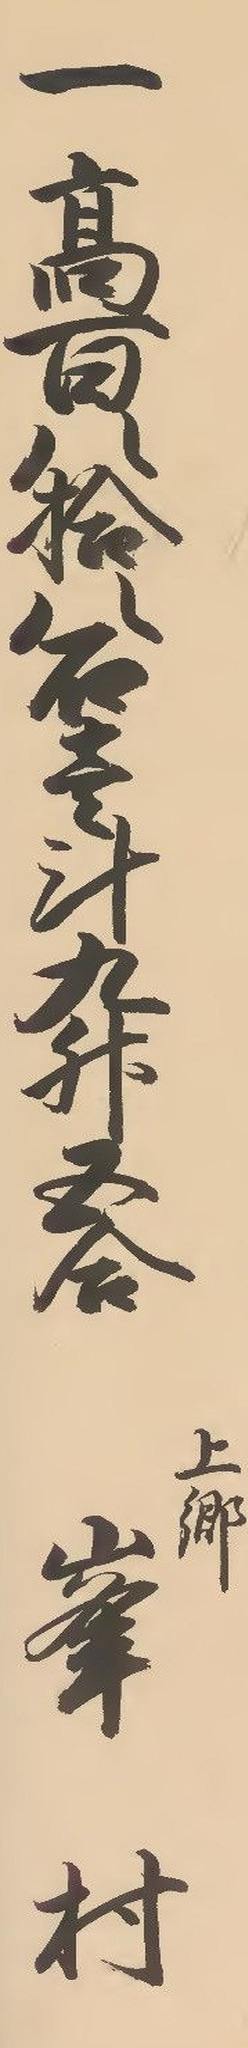一高百八拾八石壱斗九升五合峯村
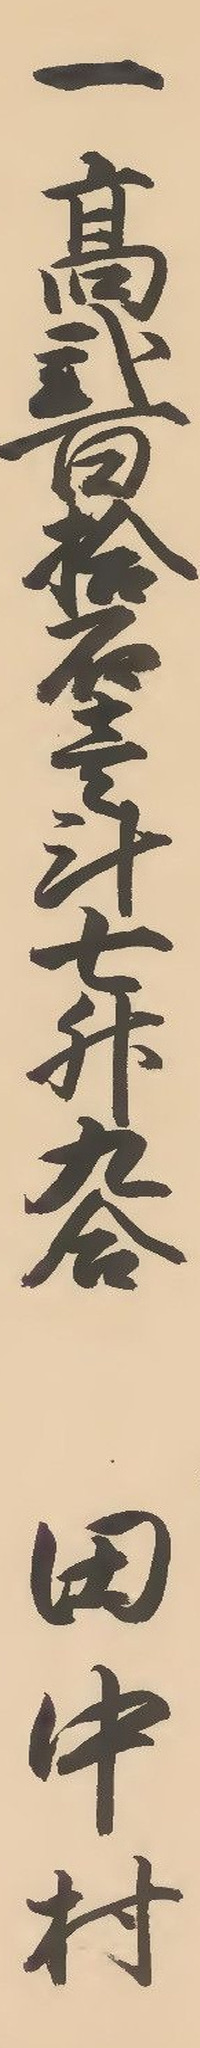一高弐百拾石壱斗七升九合田中村
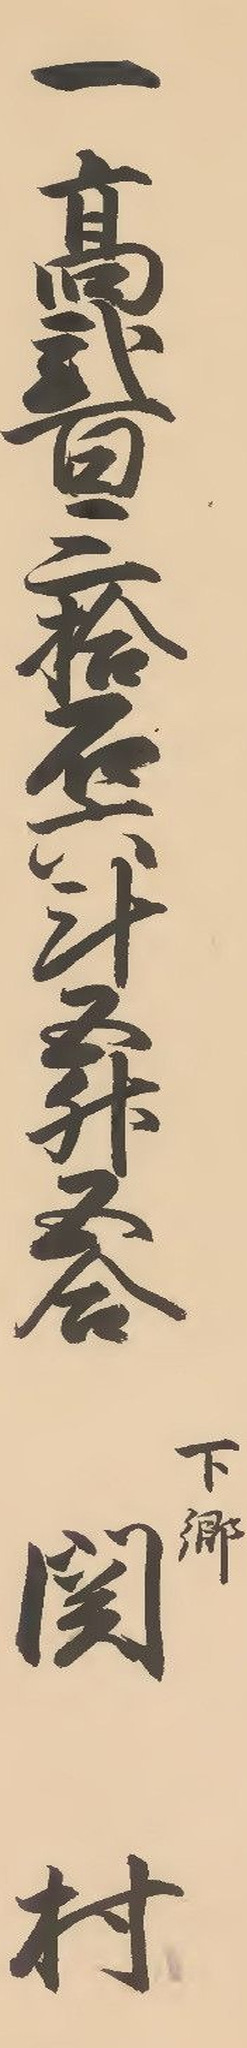一高弐百三拾石六斗五升五合関村
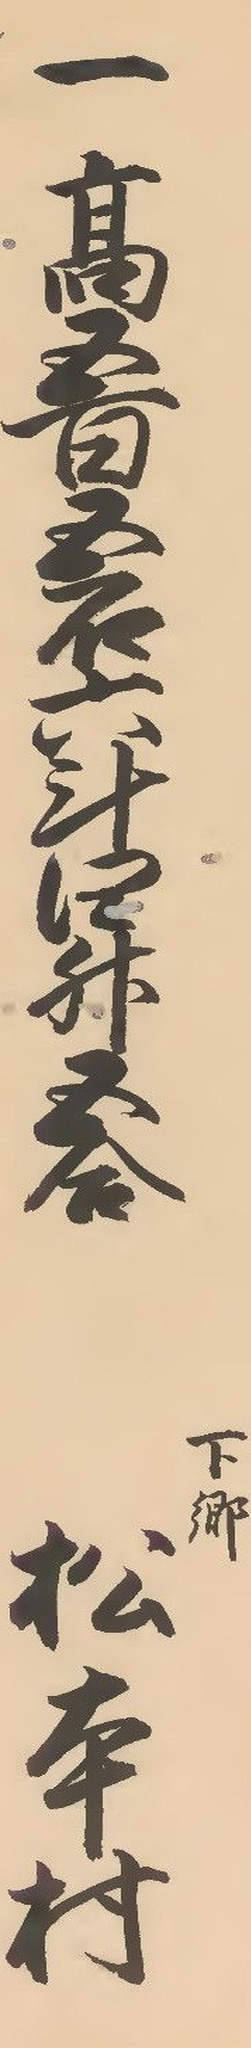一高五百五石六斗四升五合松本村

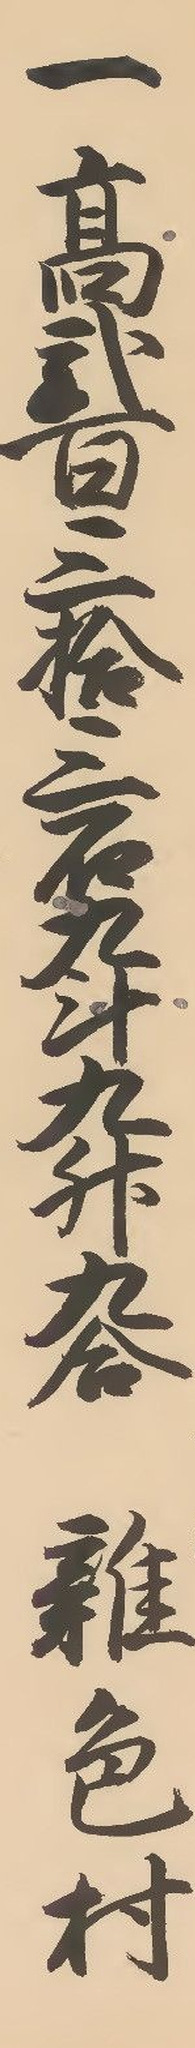一高弐百三拾三石九斗九升九合雑色村
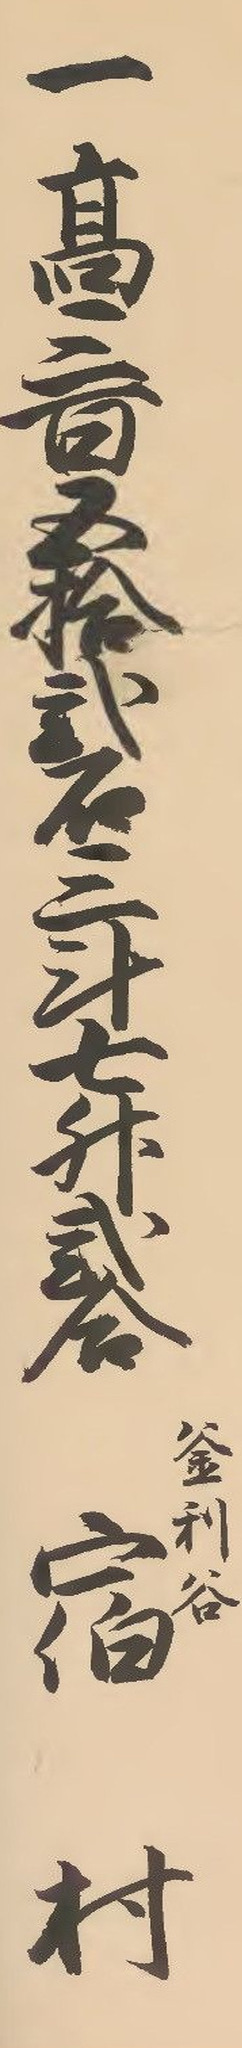一高三百五拾弐石三斗七升弐合宿村
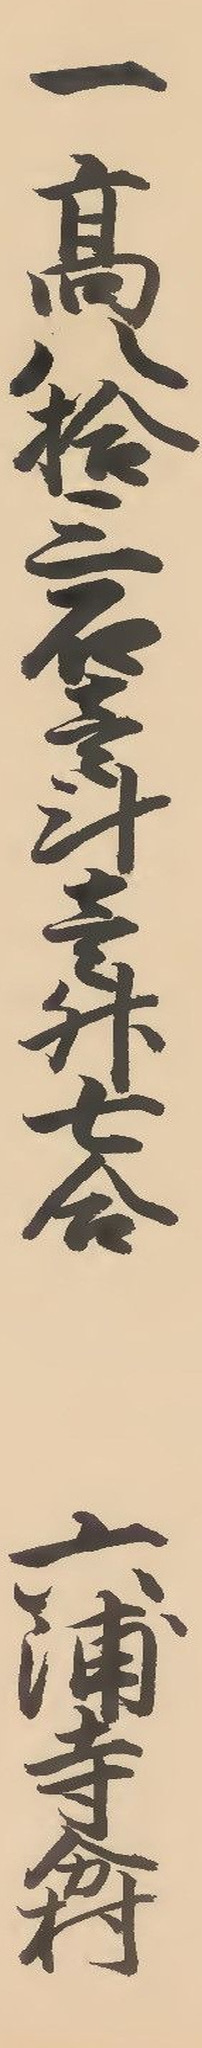一高八拾三石壱斗壱升七合六浦寺分村
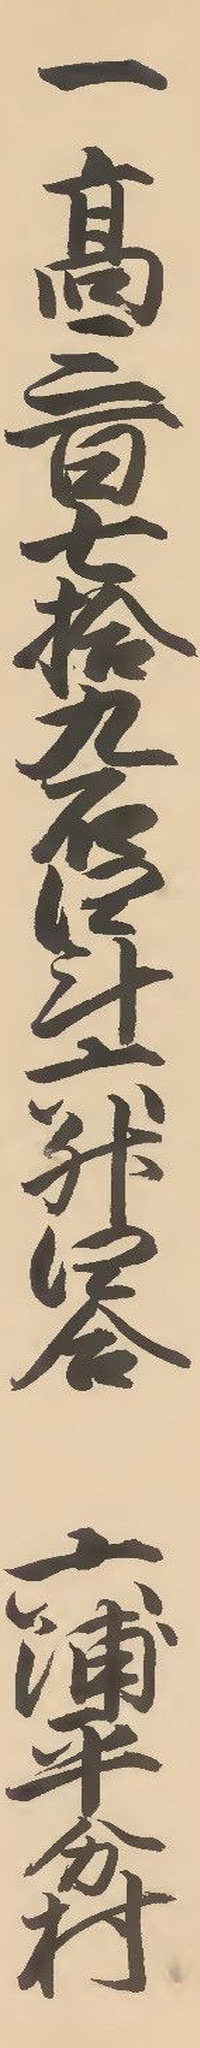一高三百七拾九石四斗六升四合六浦平分村
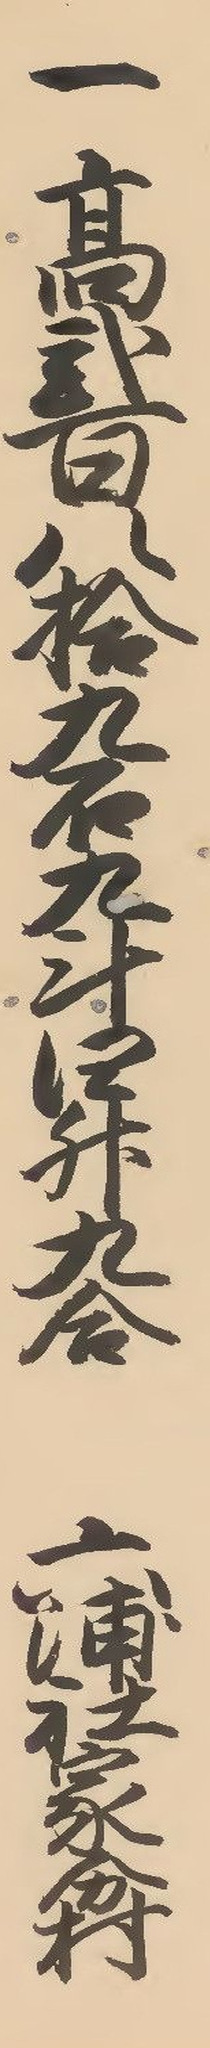一高弐百八拾九石九斗四升九合六浦社家分村

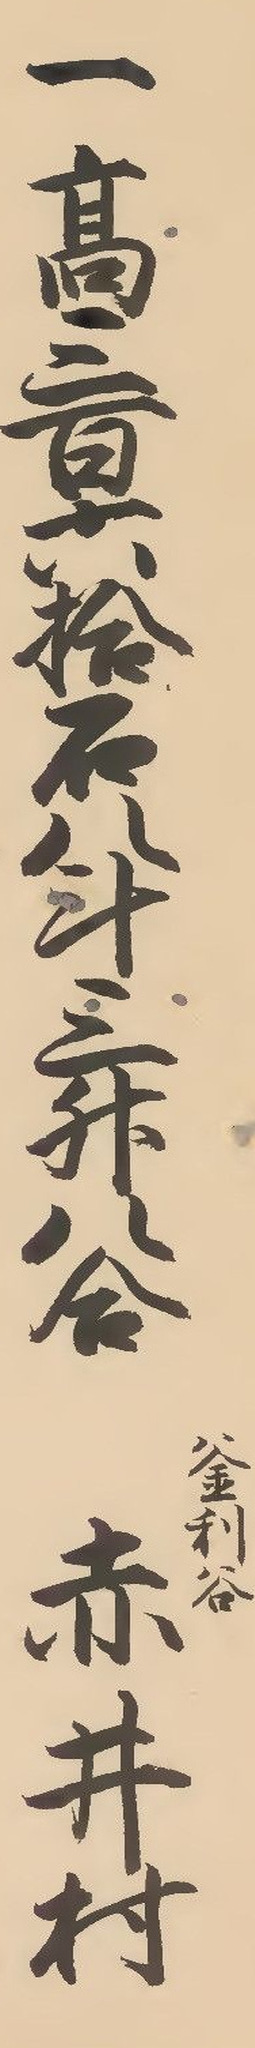一高三百六拾石八斗三升八合赤井村
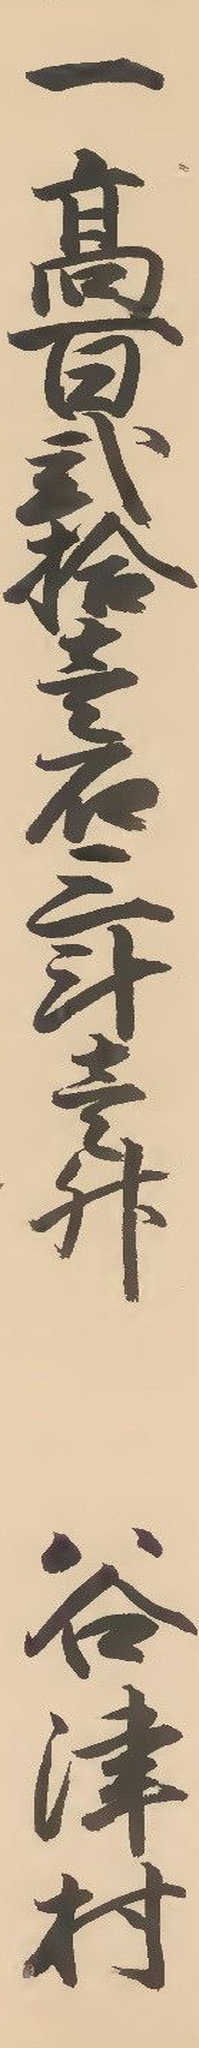一高百弐拾壱石三斗壱升谷津村
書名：武蔵国郷帳　上
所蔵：国立公文書館 National Archives of Japan
